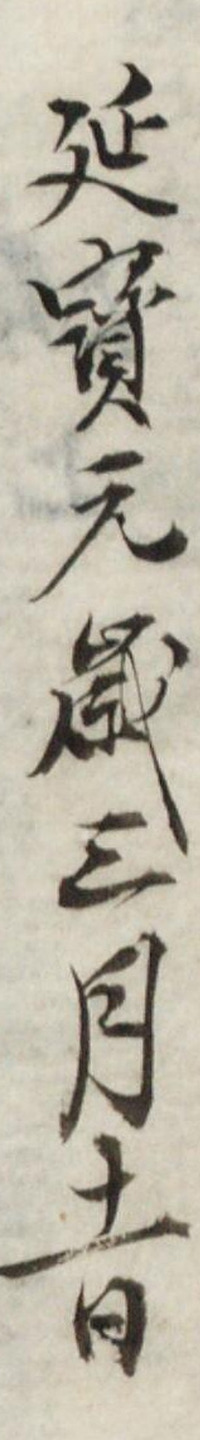延宝元歳三月十一日
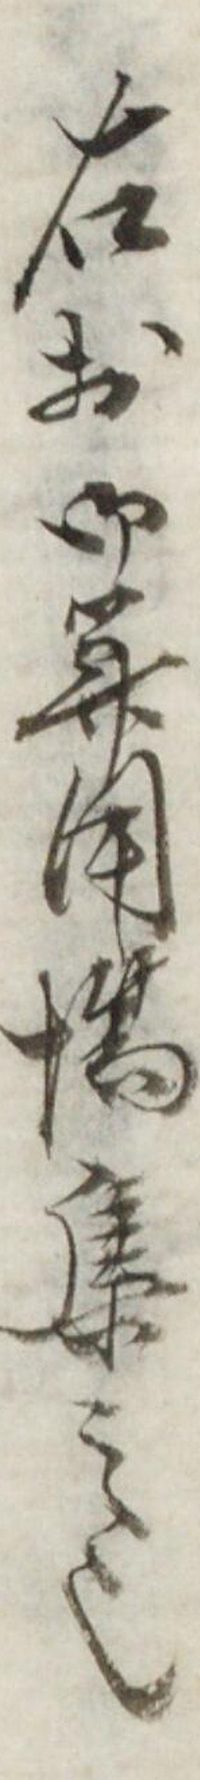右於御算用場集々也
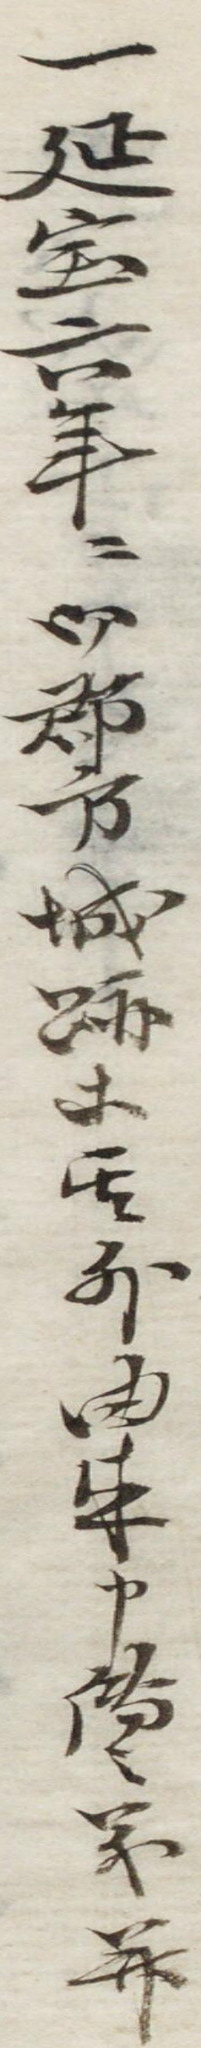一延宝六年に御郡方城跡等其外由来申伝之儀并
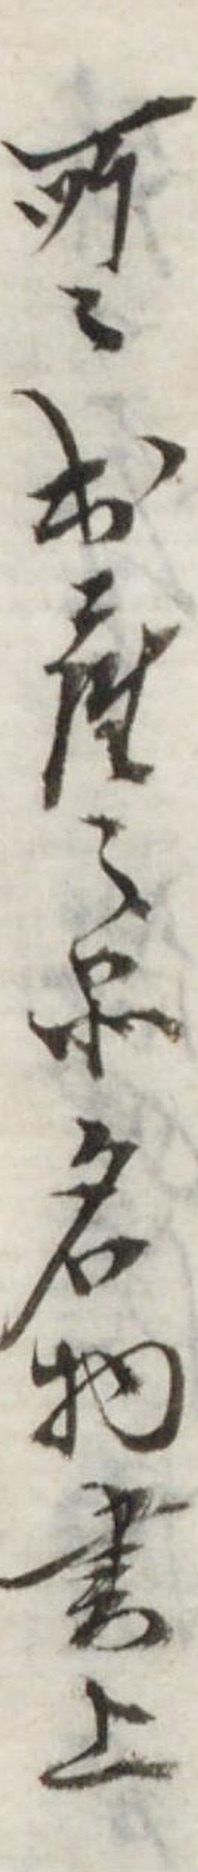所々出産之品名物書上
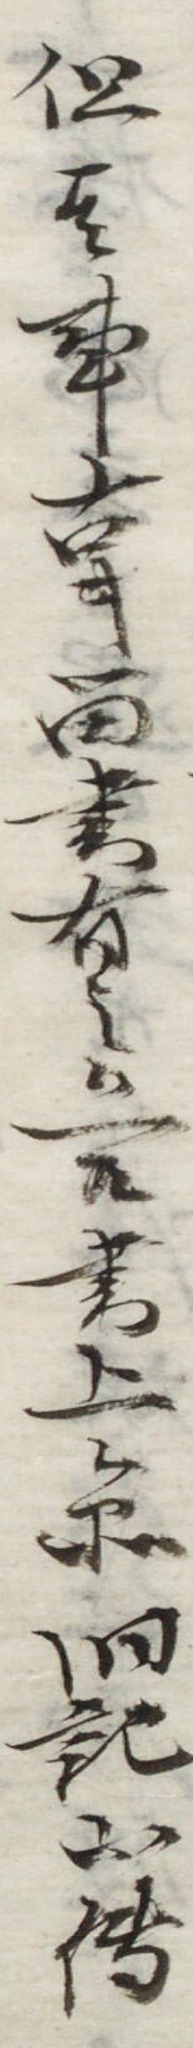但其事古き留書有之候へ共書上候品旧記不伝
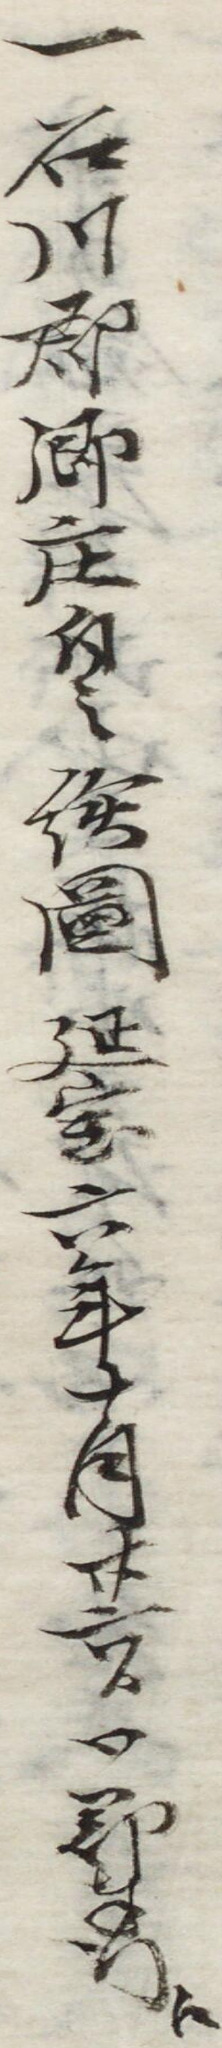一石川郡郷庄付之絵図延宝六年十月廿二日御郡奉行え
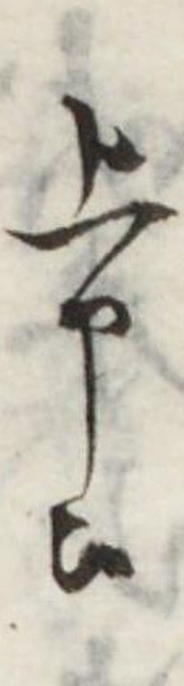上申候
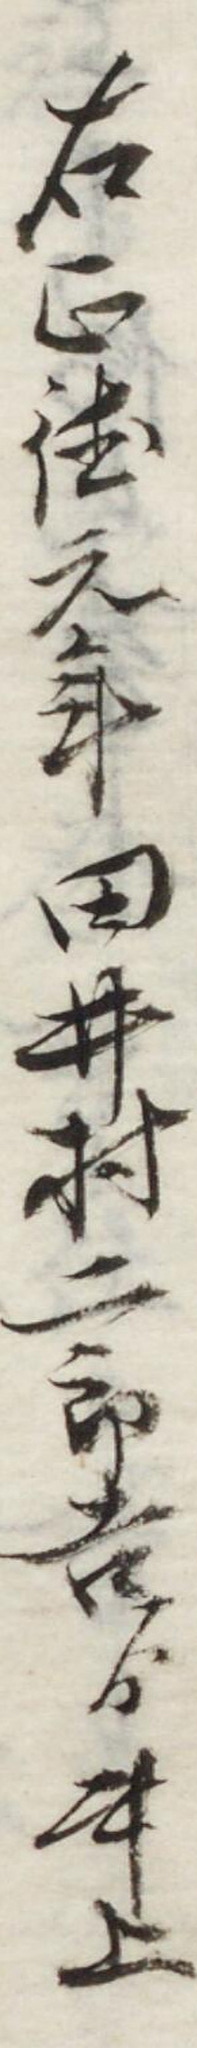右正徳元年田井村二郎吉ゟ書上
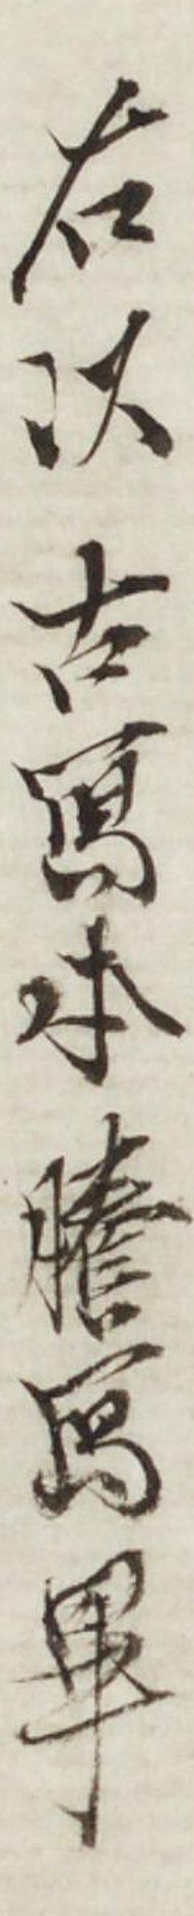右以古写本謄写畢
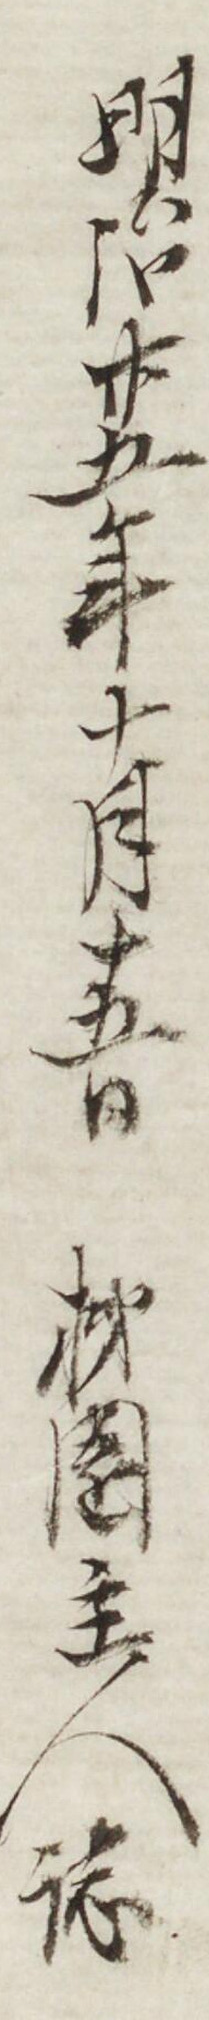明治廿五年十月十五日梯園主人誌
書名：古老旧聞紀略
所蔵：Ishikawa Prefectural Library
